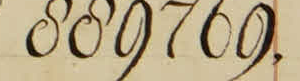889769
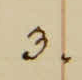3
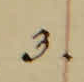3
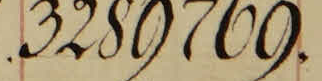3289769
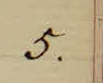5.
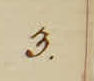3.
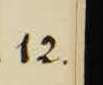12.
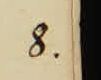8.
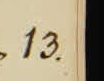13.
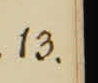13.
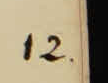12.
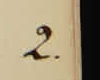2.
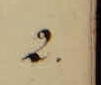2.
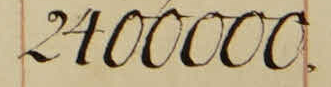2406000
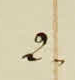2
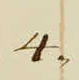4
